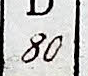80
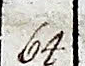64
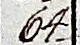64
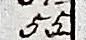55
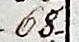68
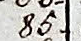85
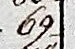69
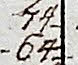74
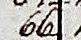66
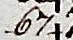67
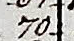70
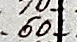60
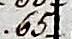65
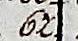62
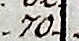70
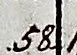58
